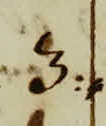2:
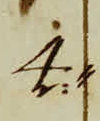4:
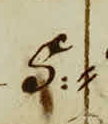5:
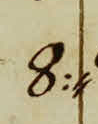8:
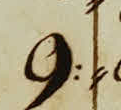9:
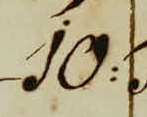10:
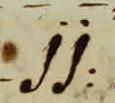11:
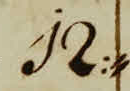12:
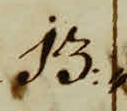13:
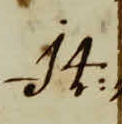14:
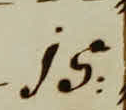15:
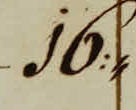16:
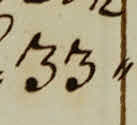33
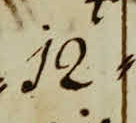12
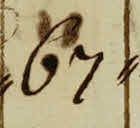67
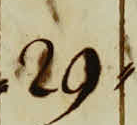29
